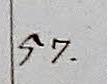57.
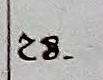28.
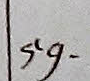59
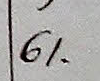61.
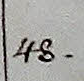48
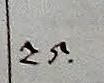25.
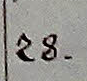28
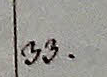33.
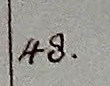48.
